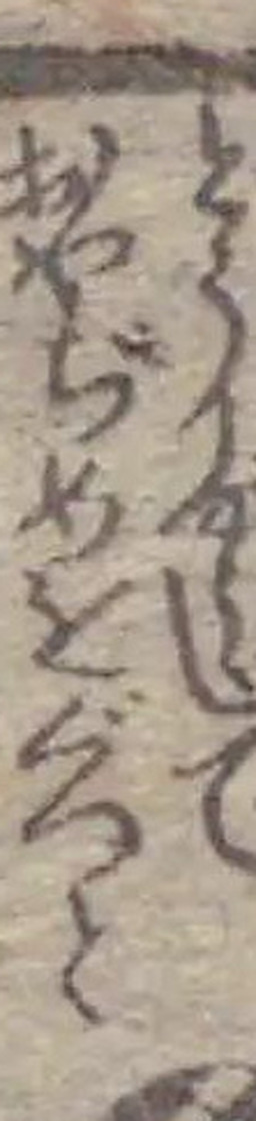おやぢめをぐつと
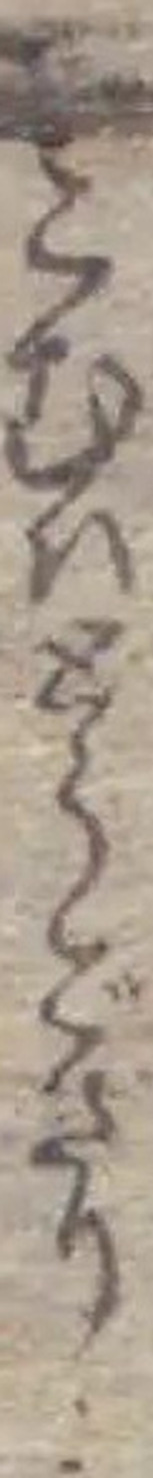こむはどうごさり
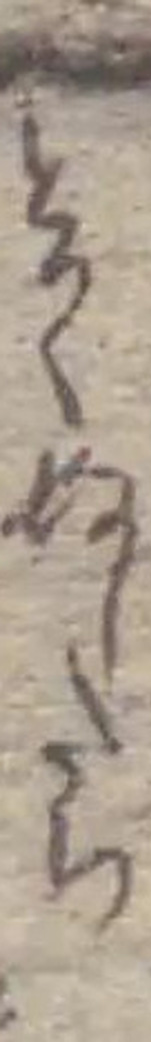とかくぬしたち
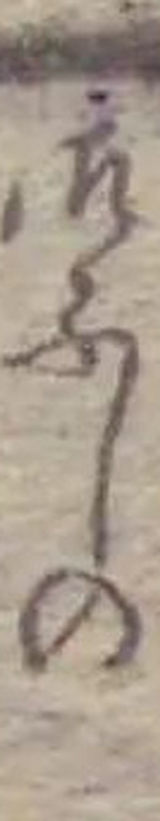御ふしの

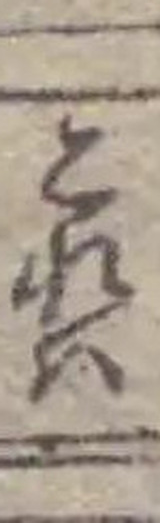これは
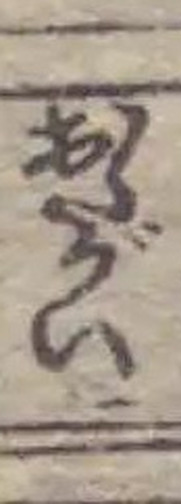おたがい
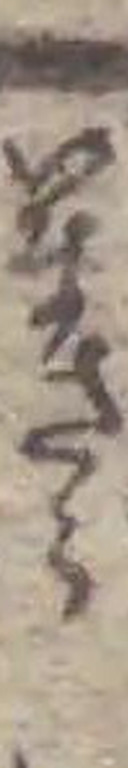いまさら
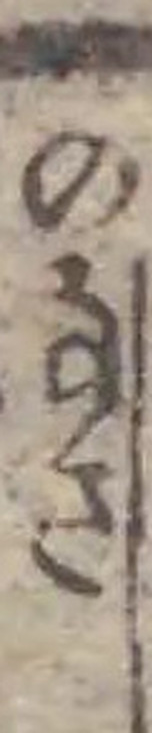の事さ
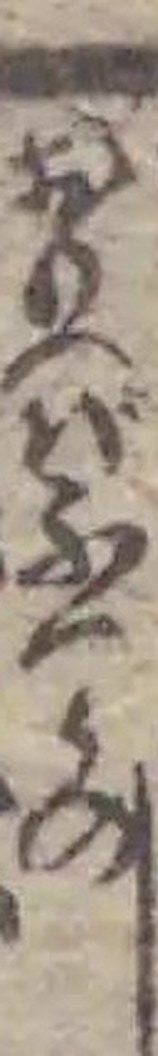おもへばふつうの
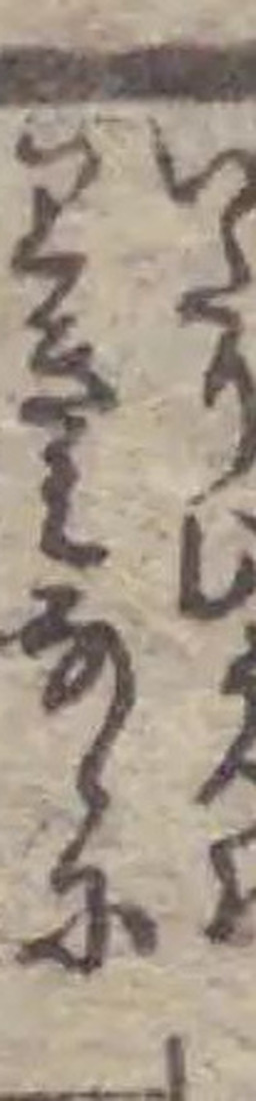りきみなしに
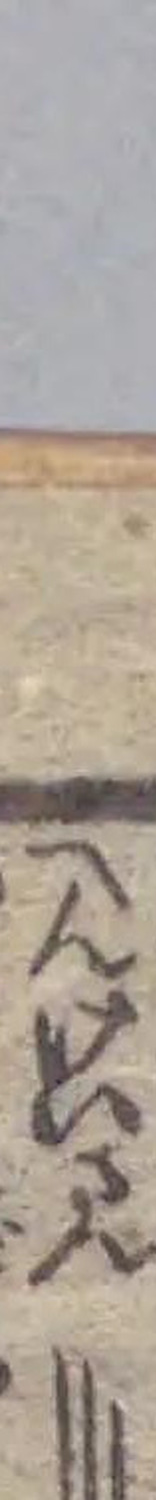へんけいさん
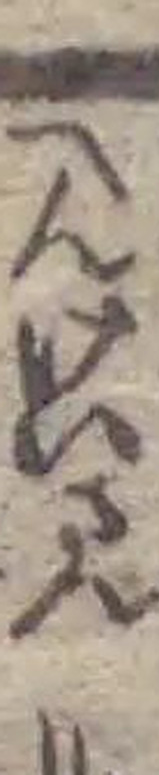へんけいさん
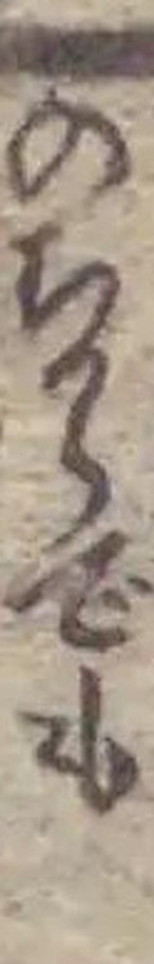のちからでも
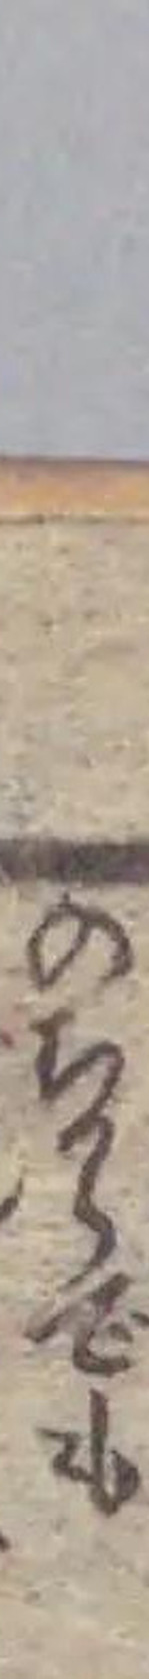のちからでも
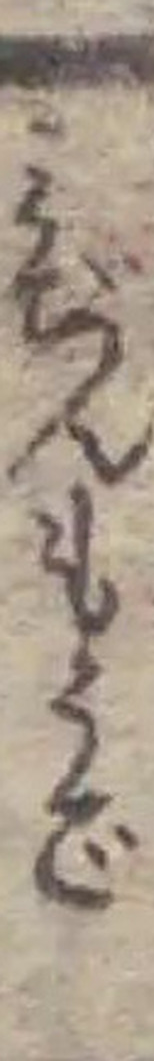みぢんもうご
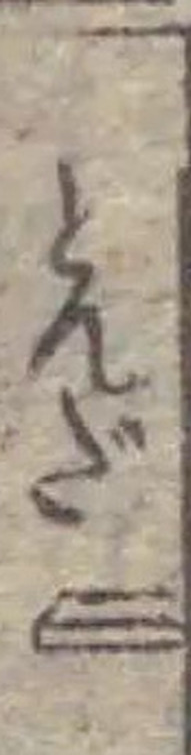とんだ
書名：通増安宅関 2巻
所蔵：国立国会図書館 National Diet Library, JAPAN
